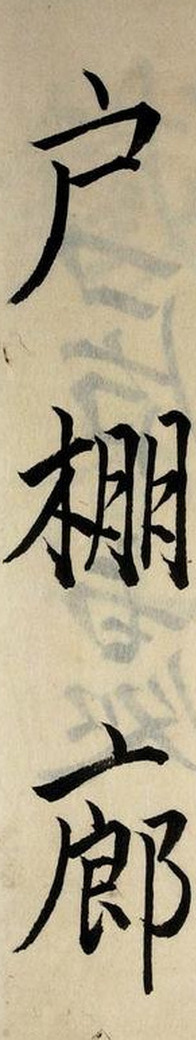戸棚廊
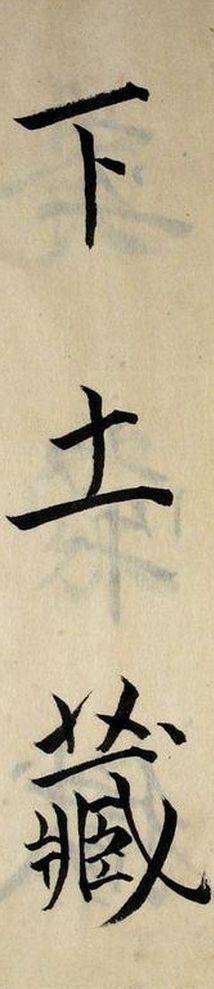下土藏
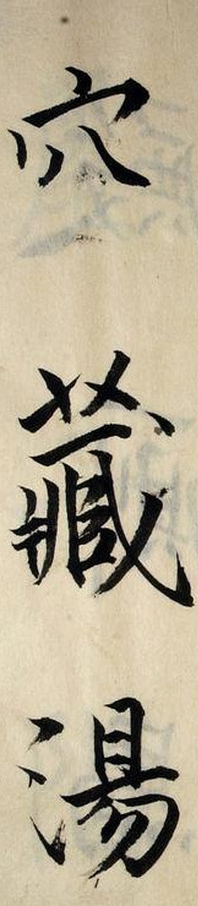穴藏湯

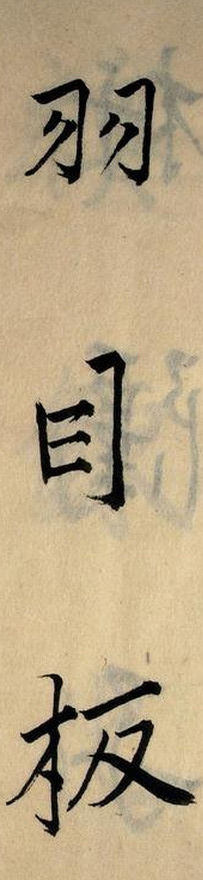羽目板
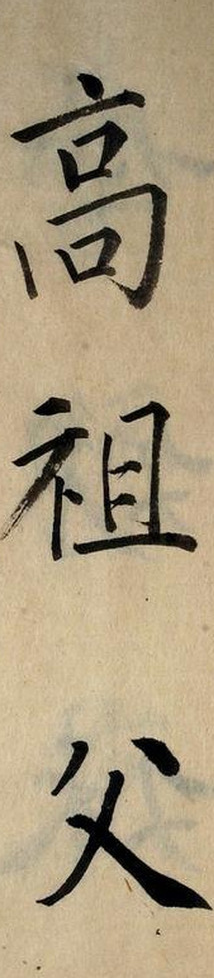高祖父
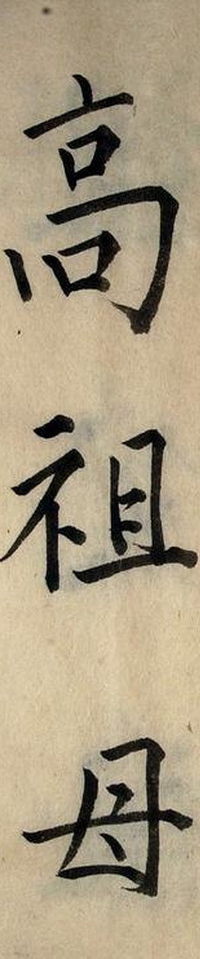高祖母

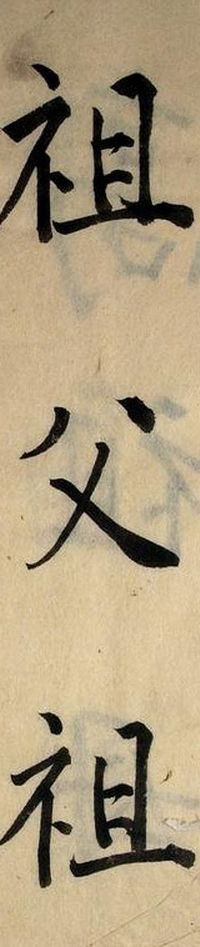祖父祖
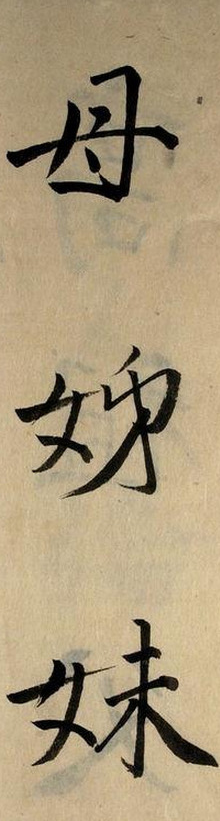母姉妹
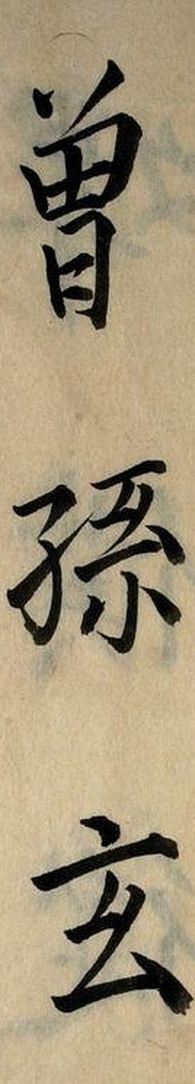曽孫玄
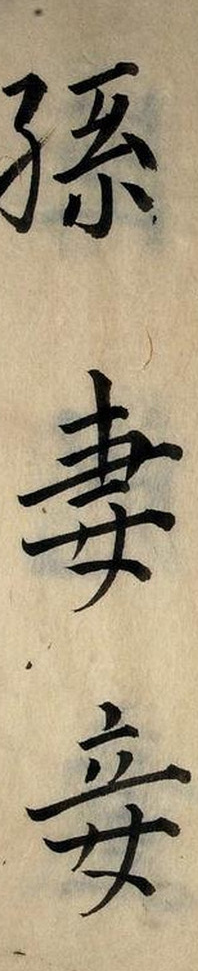孫妻妾

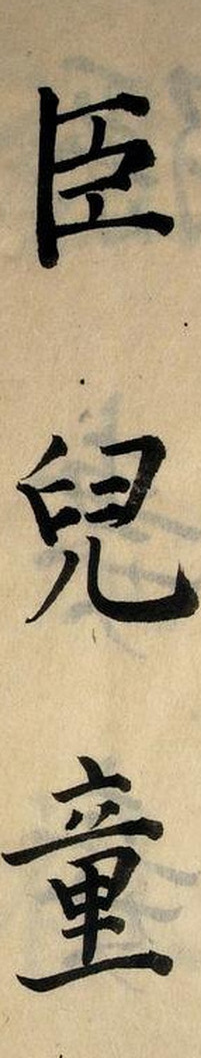臣児童
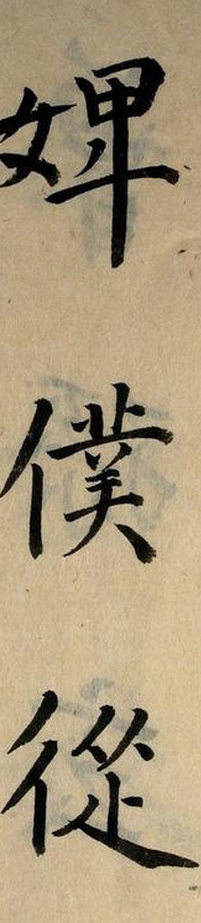婢僕従
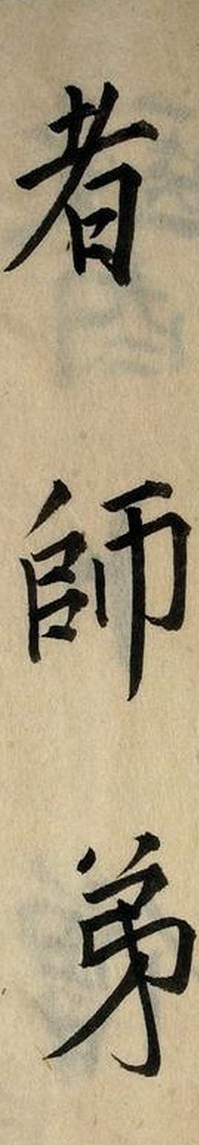者師弟
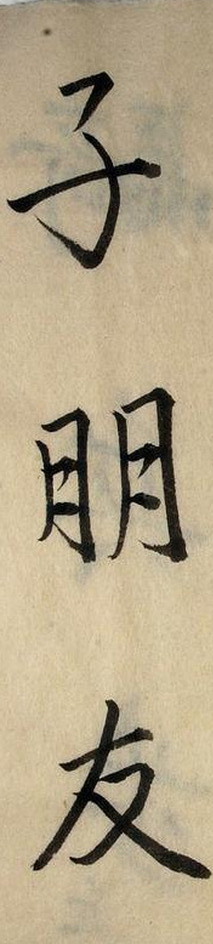子朋友
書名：御手本（手習）
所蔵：福井県文書館 Fukui Prefectural Archives
